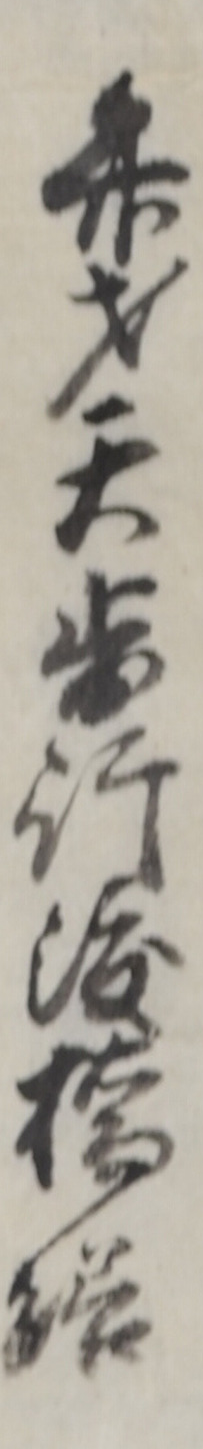弁才天歩行渡橋繕
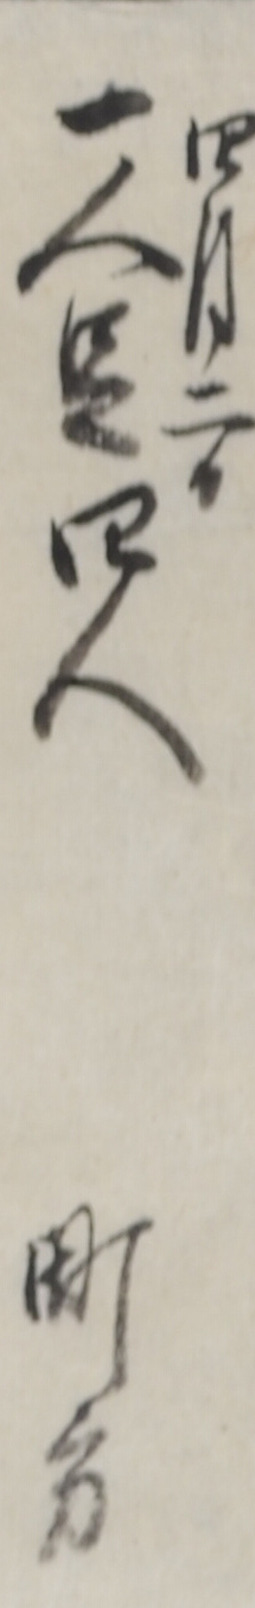一人足四人町方
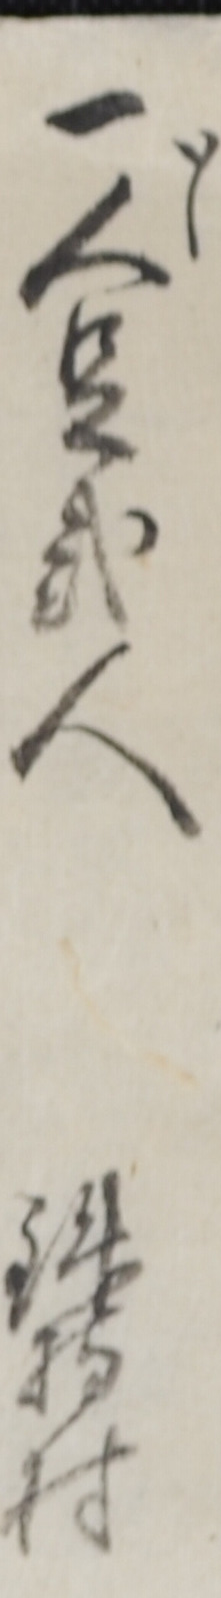一人足弐人鉾持村
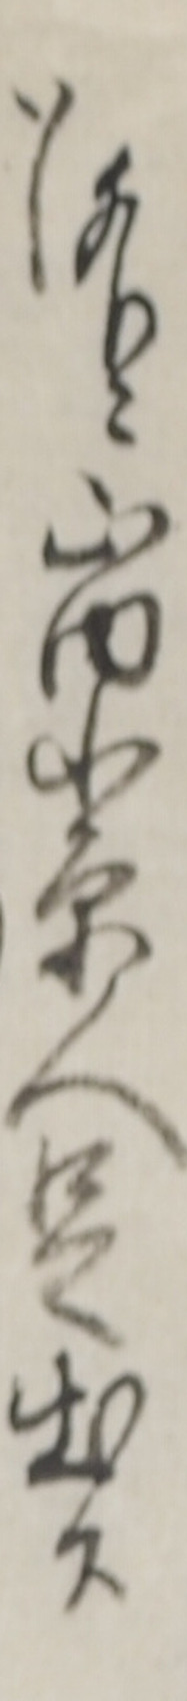外ニ山田小原人足出ス
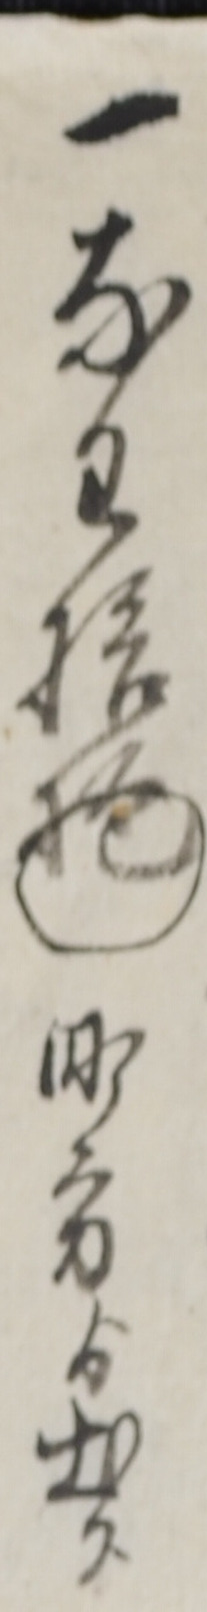一なわ拾町方ゟ出ス
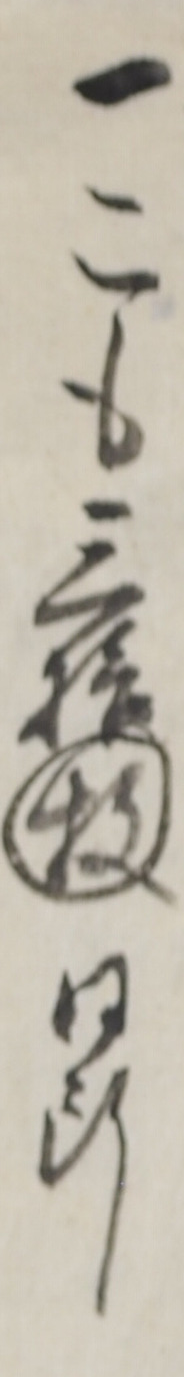一こも三拾同断
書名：弁才天歩行渡橋繕
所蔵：伊那市立高遠町図書館・合同会社AMANE
